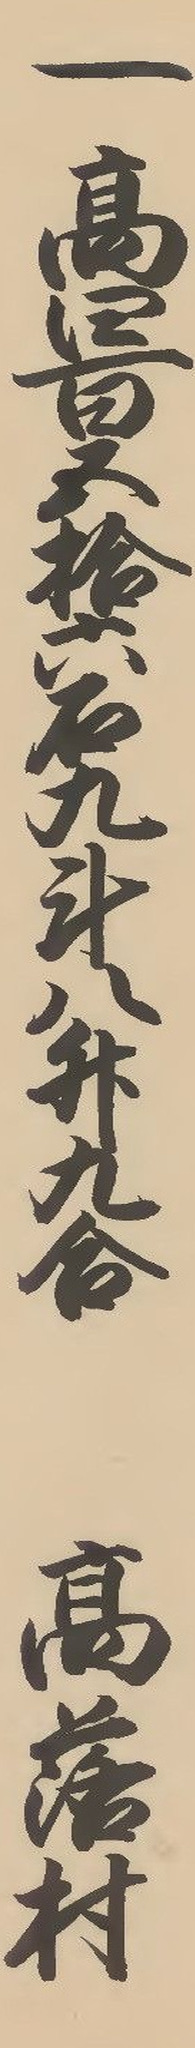一高四百五拾六石九斗八升九合高落村
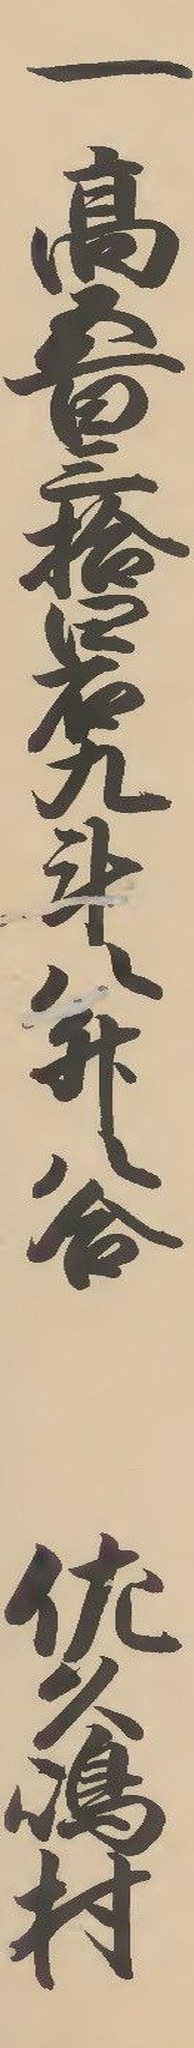一高五百三拾四石九斗八升八合佐久島村
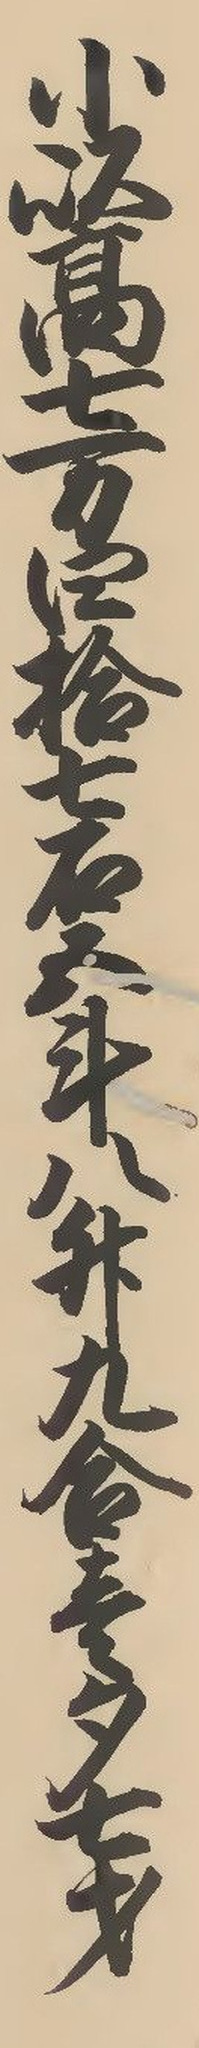小以高七万四拾七石五斗八升九合壱勺七才
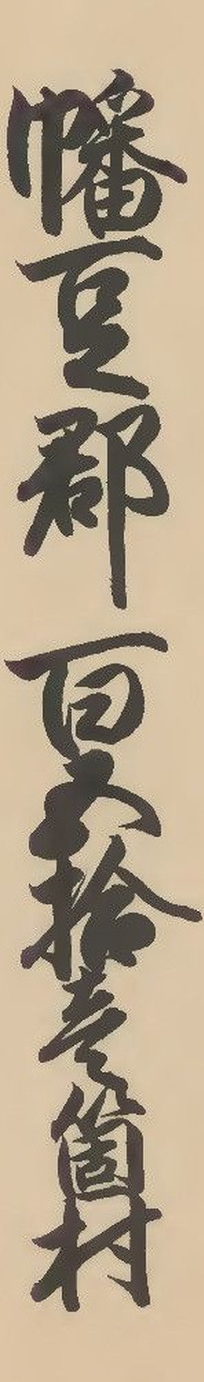幡豆郡百五拾壱箇村

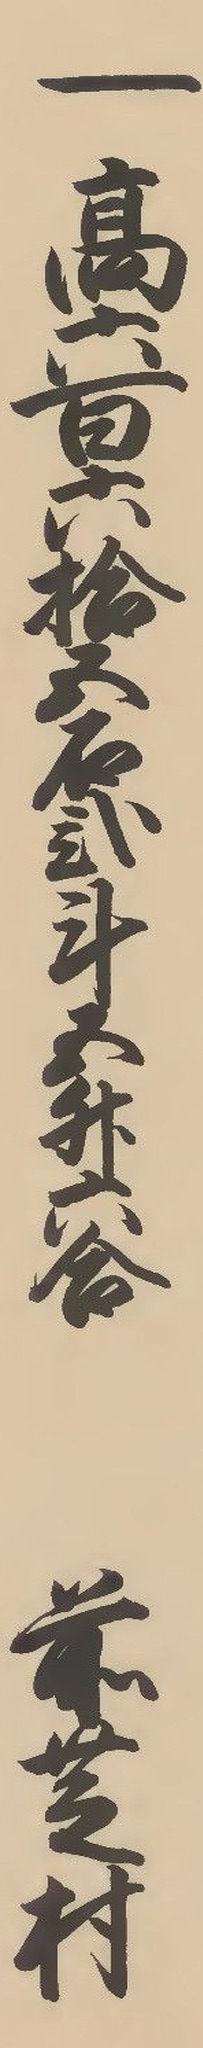一高六百六拾五石弐斗五升六合前芝村
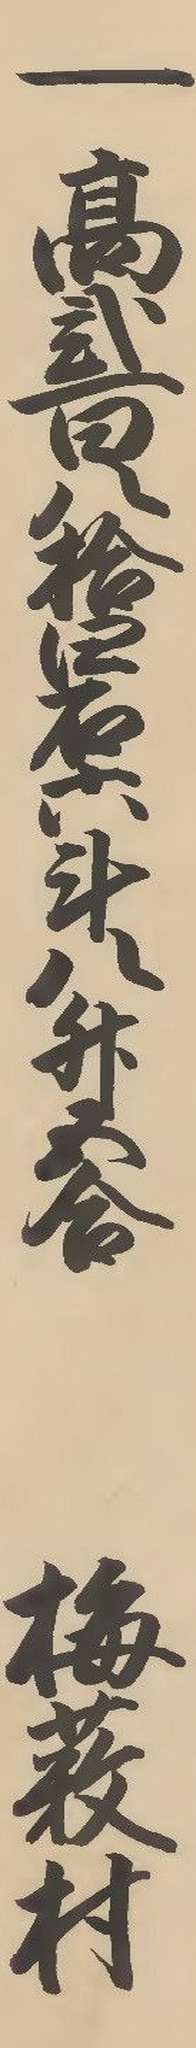一高弐百八拾四石六斗八升五合梅薮村
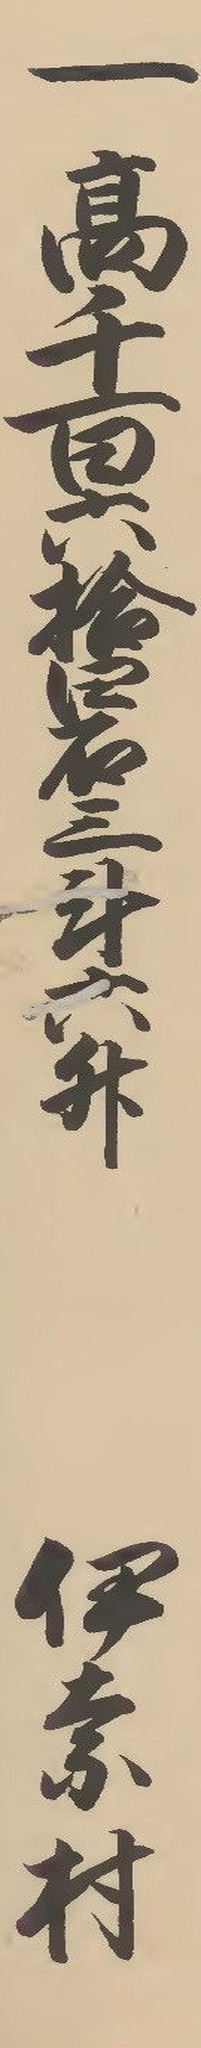一高千百六拾四石三斗六升伊奈村
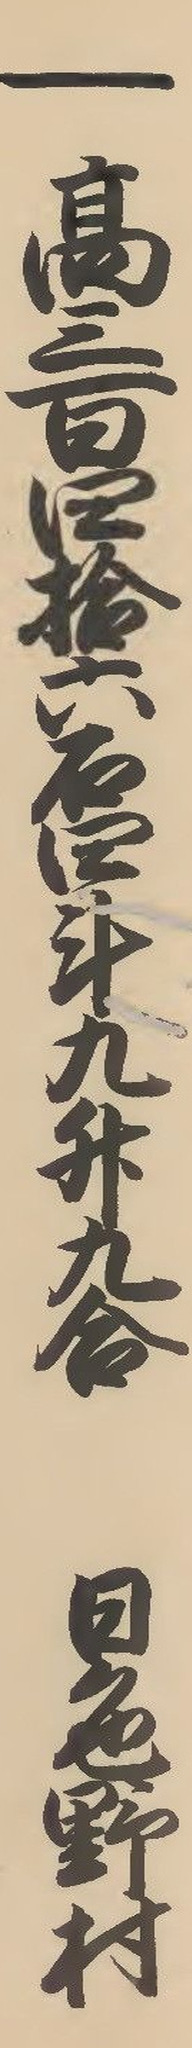一高三百四拾六石四斗九升九合日色野村
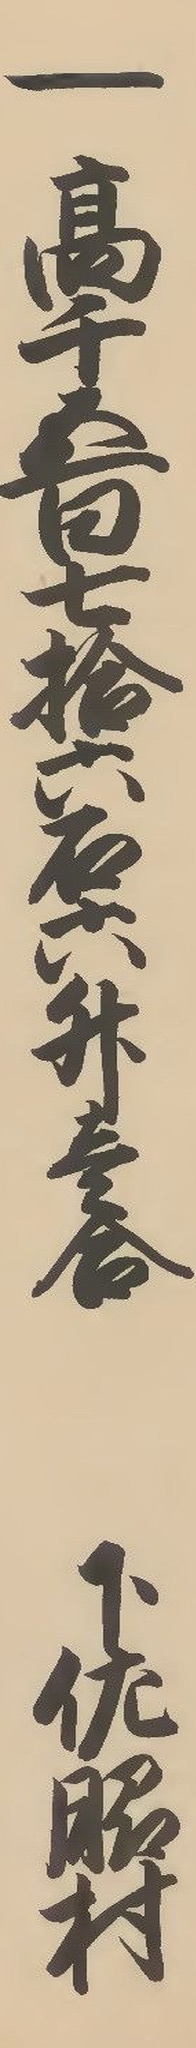一高千五百七拾六石六升壱合下佐脇村
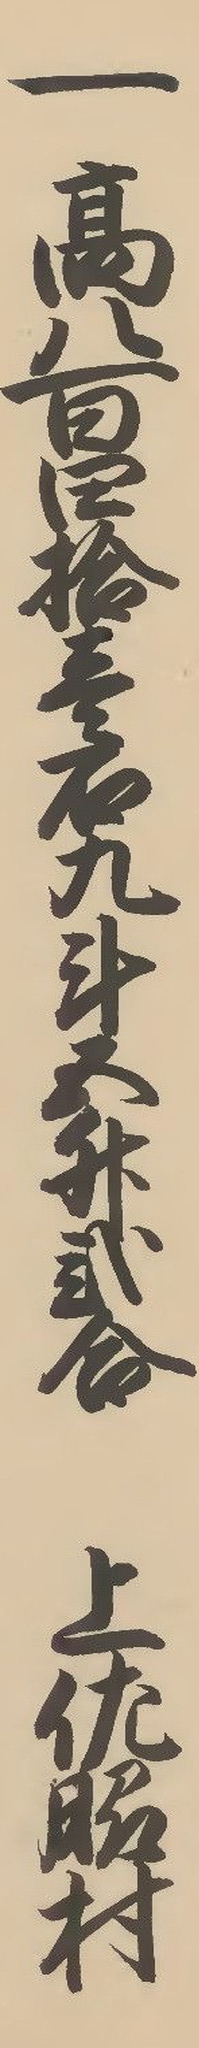一高八百四拾壱石九斗五升弐合上佐脇村
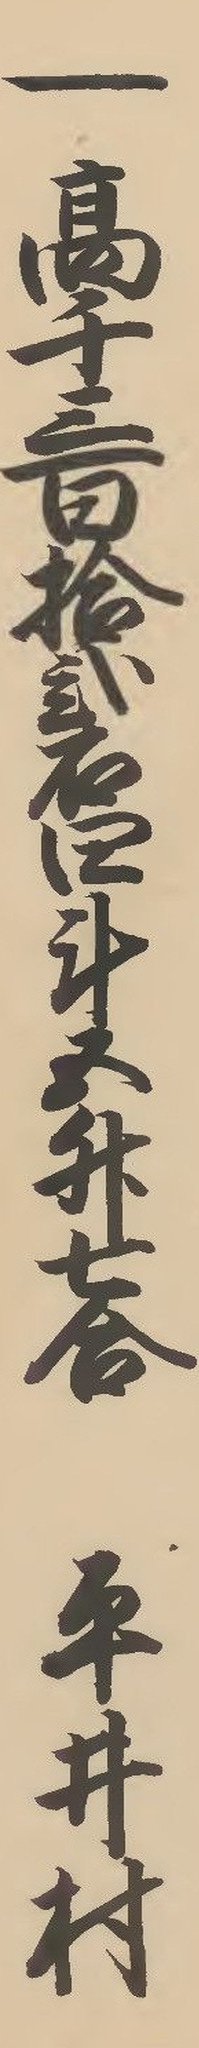一高千三百拾弐石四斗五升七合平井村

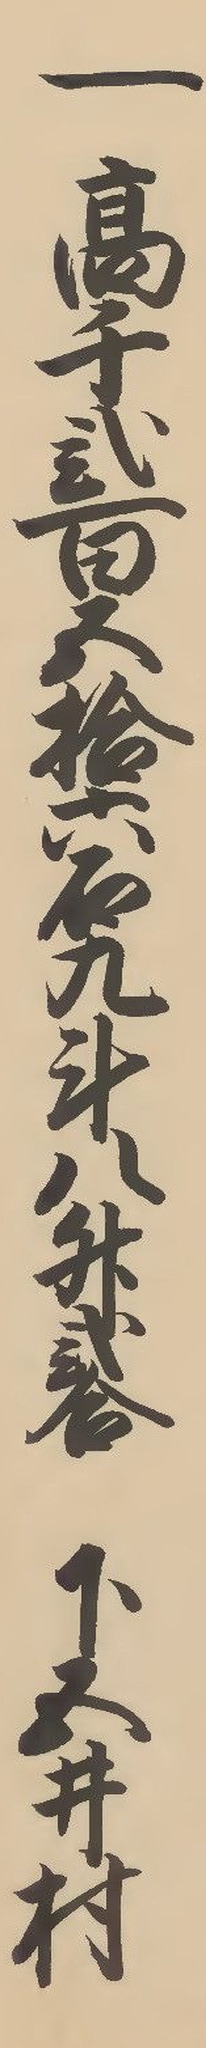一高千弐百五拾六石九斗八升弐合下五井村
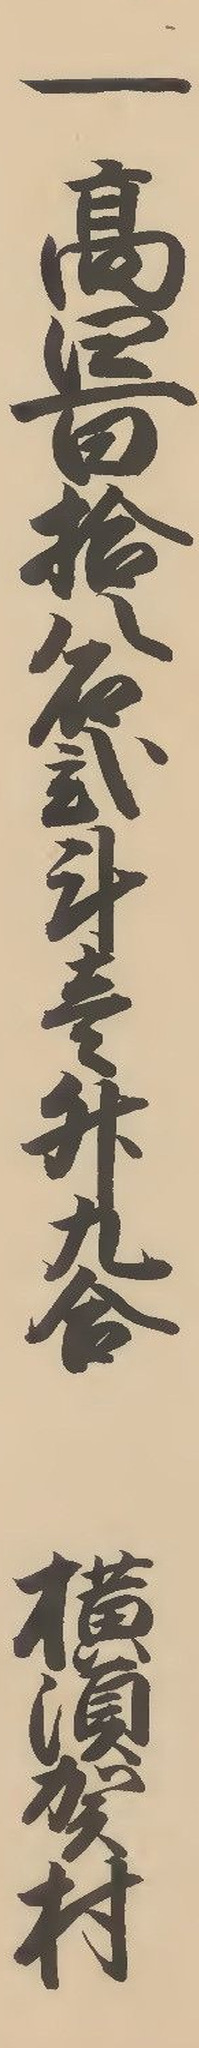一高四百拾八石弐斗壱升九合横須賀村
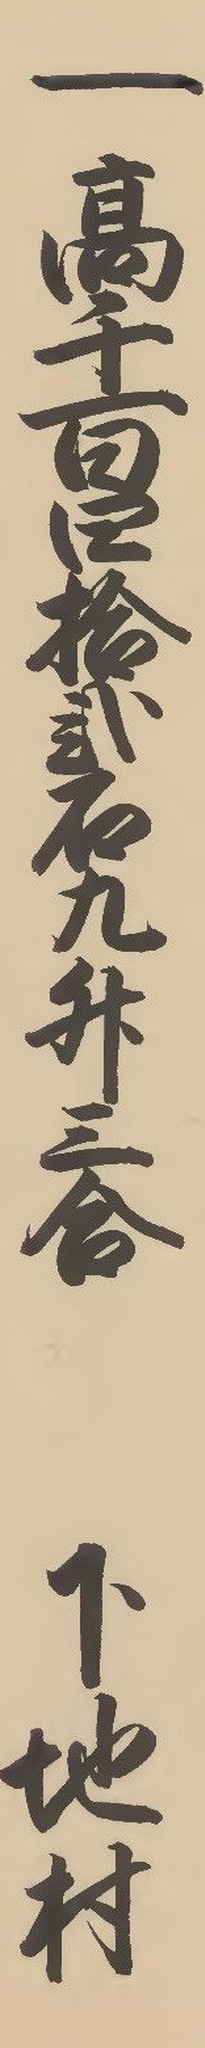一高千百四拾弐石九升三合下地村
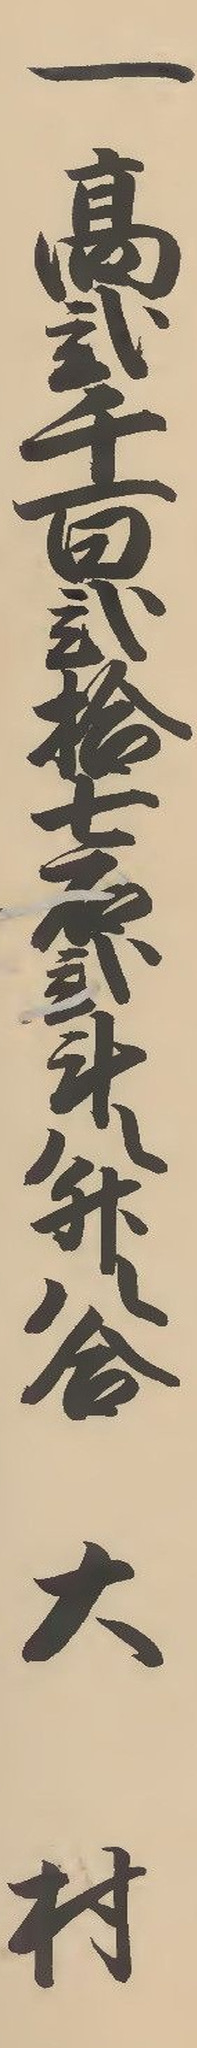一高弐千百弐拾七石弐斗八升八合大村
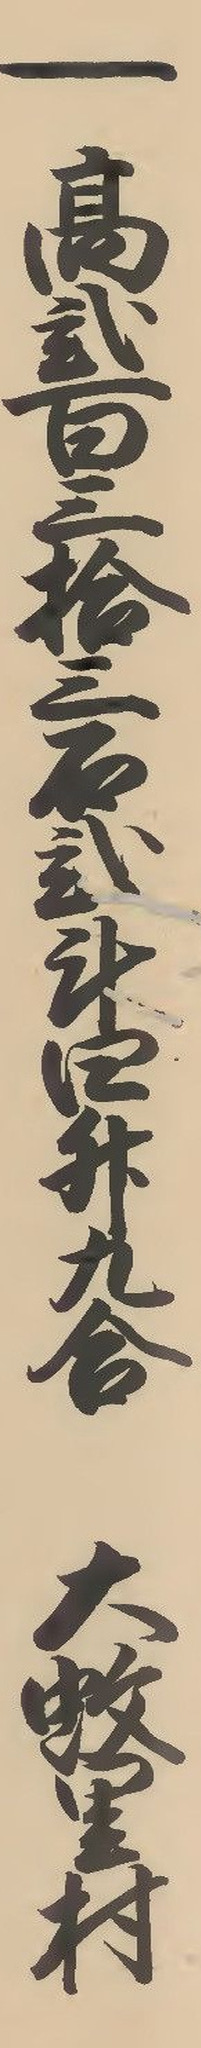一高弐百三拾三石弐斗四升九合大蚊里村
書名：三河国郷帳
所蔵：国立公文書館 National Archives of Japan
